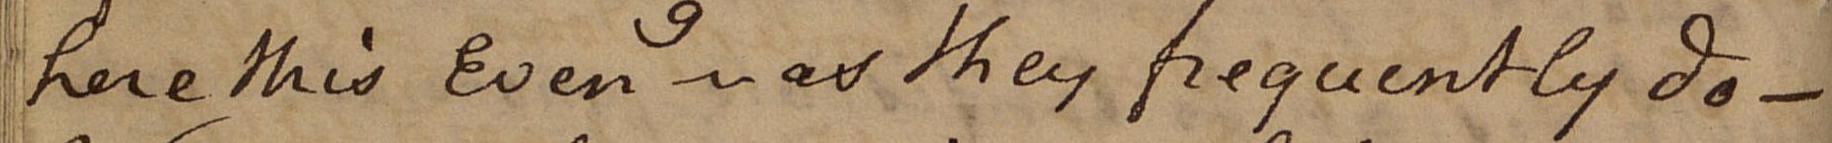here this Even^g- as they frequently do-
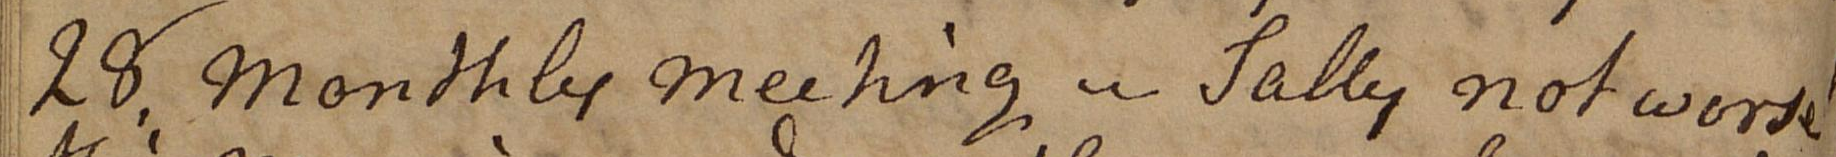28 Monthly meeting- Sally not worse
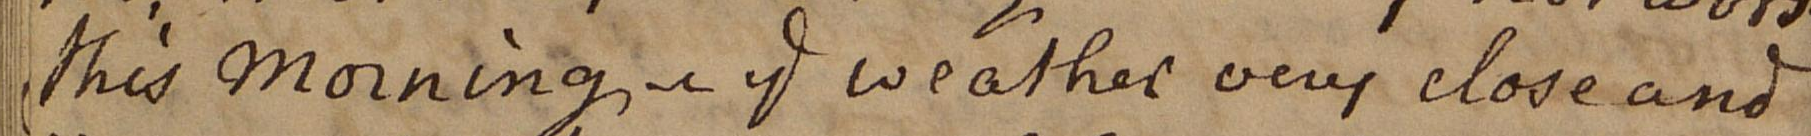this morning- y^e weather very close and
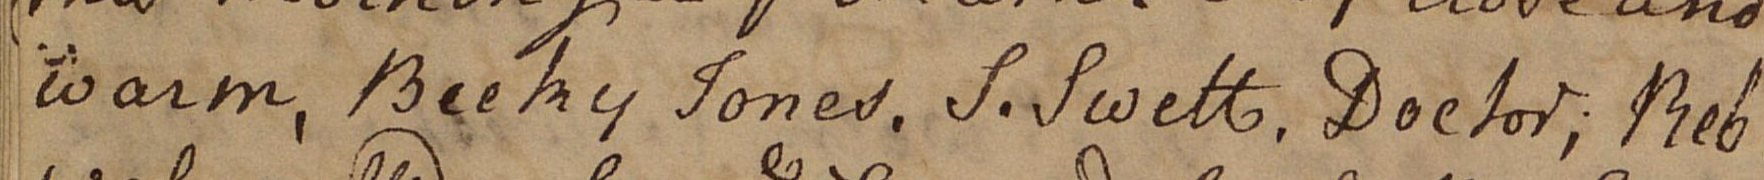warm, Becky Jones. S. Swetts, Doctor; Reb,^a
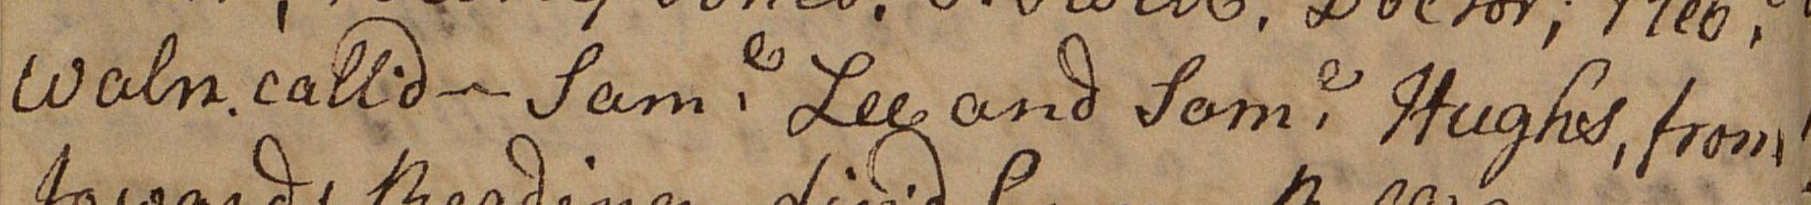Waln call'd- Sam.^l Lee and Som^l. Hughs, from
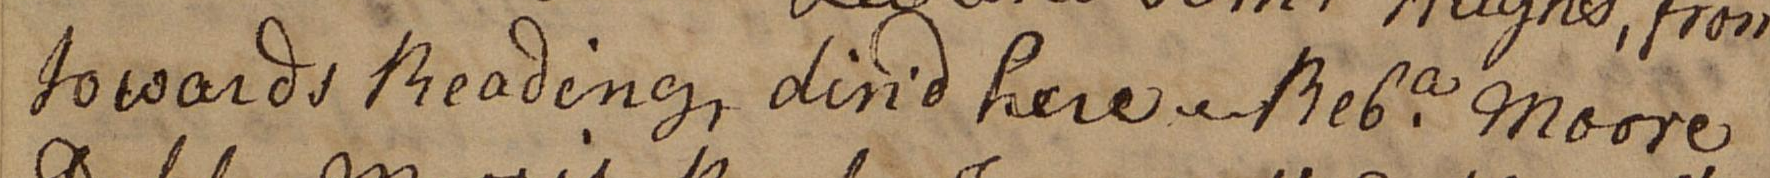towards Reading, din'd here- Reb^a. Moore
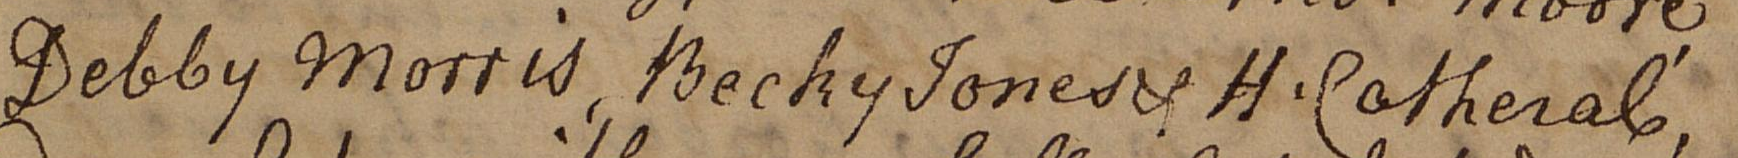Debby Morris, Becky Jones & H. Catheral,
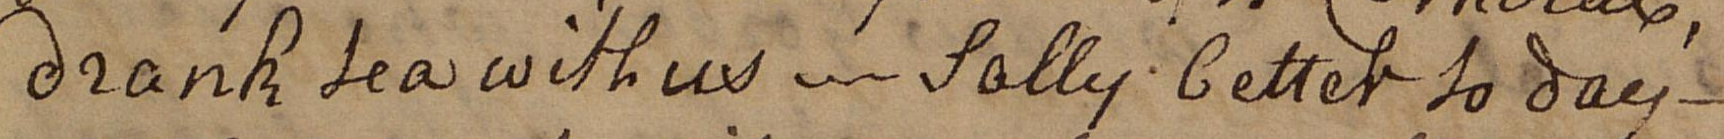drank tea with us- Sally better to day-
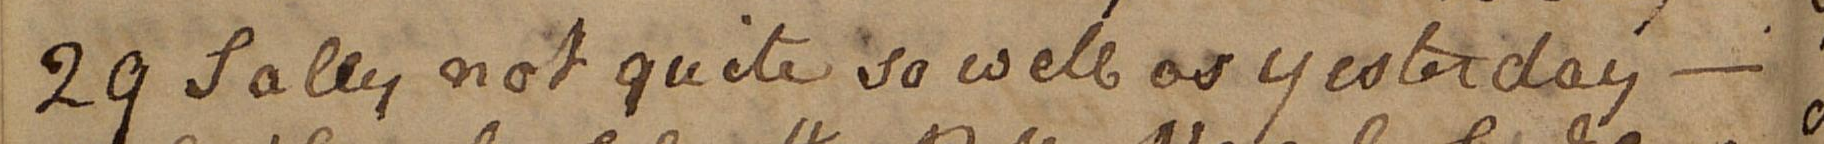29 Sally not quite so well as yesterday-
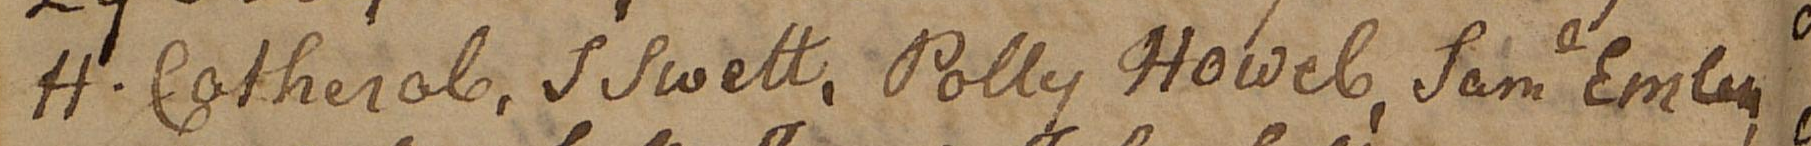H. Catheral, S Swett, Polly Howel, Sam^l Emlen
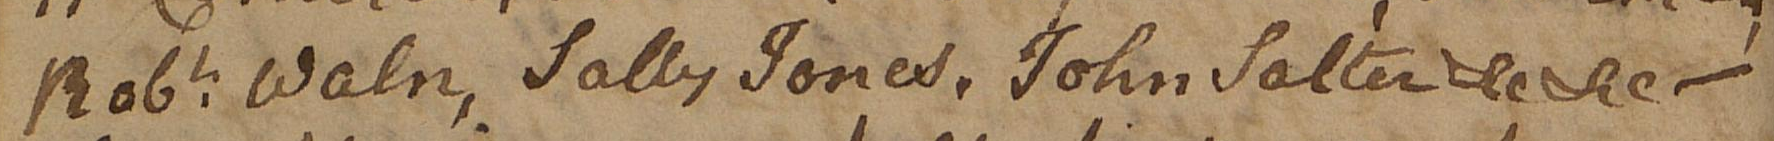Rob^t: Waln, Sally Jones. John Salter &c &c-
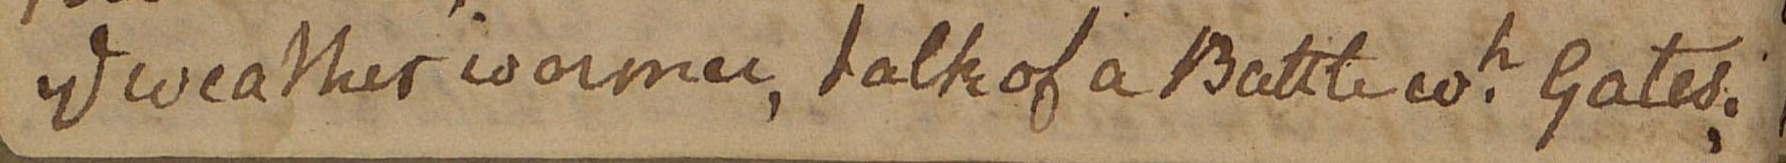y^e weather warmer, talk of a Battle w^h. Gates.
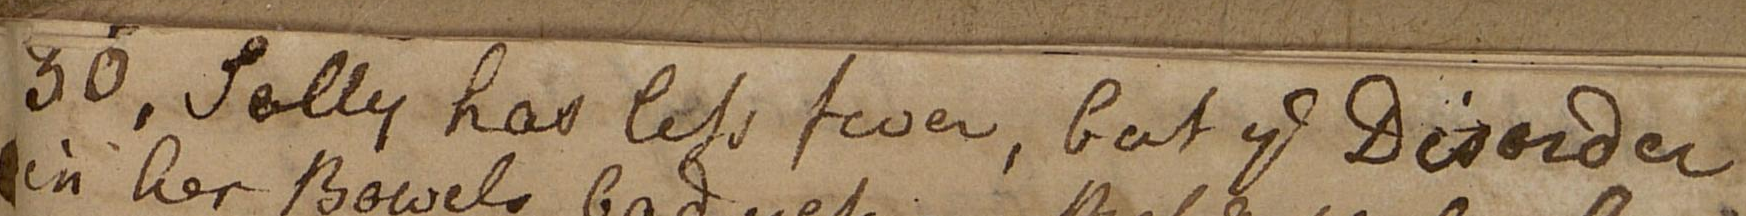30, Sally has less fever, but y^e Disorder
